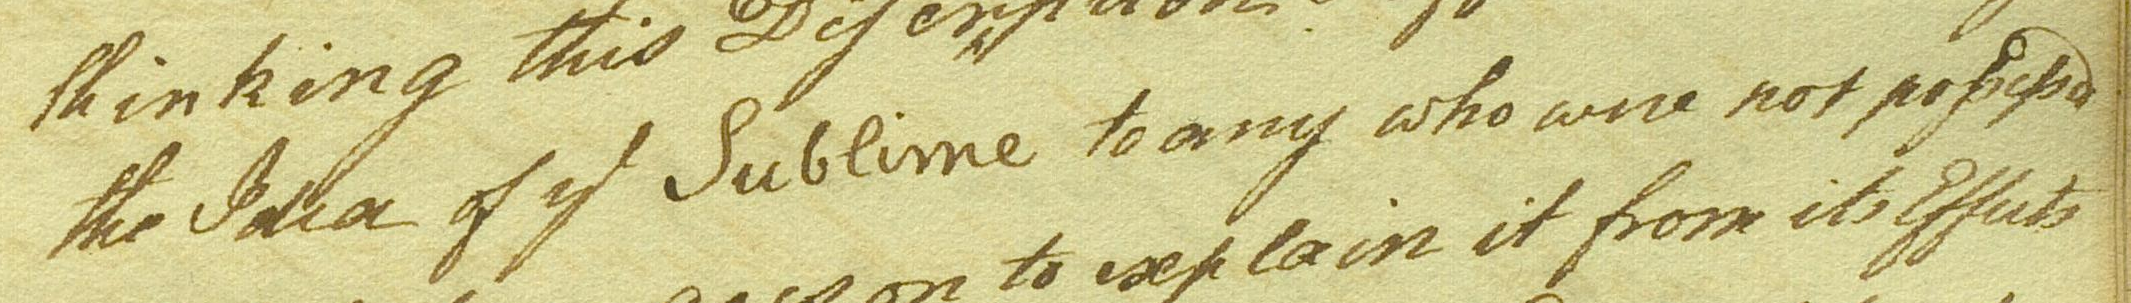the Idea of y^e Sublime to any who were not possessed
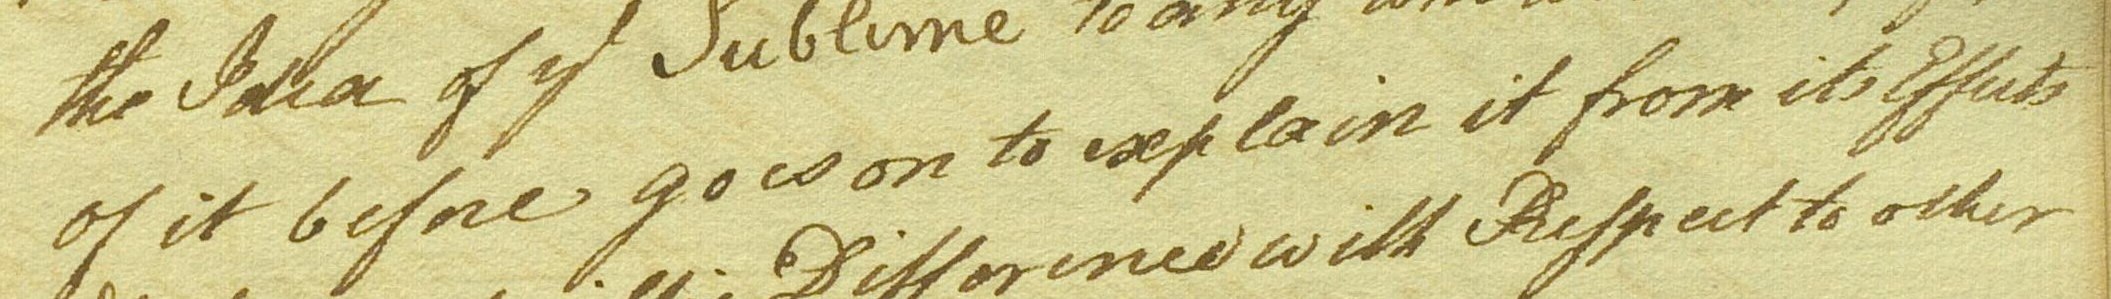of it before goes on to explain it from its Effects
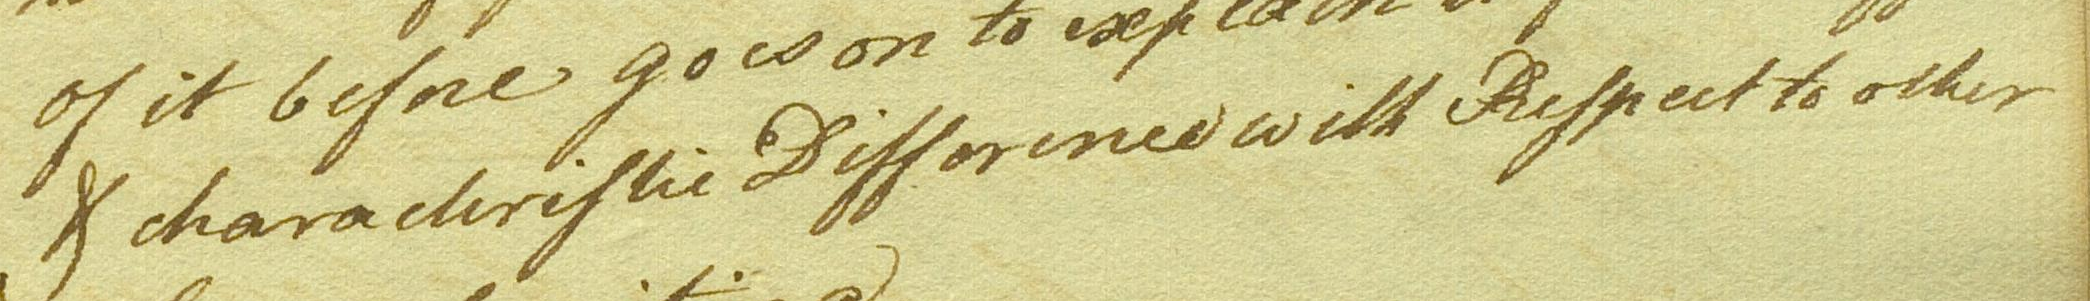& characteristic Difference with Respect to other
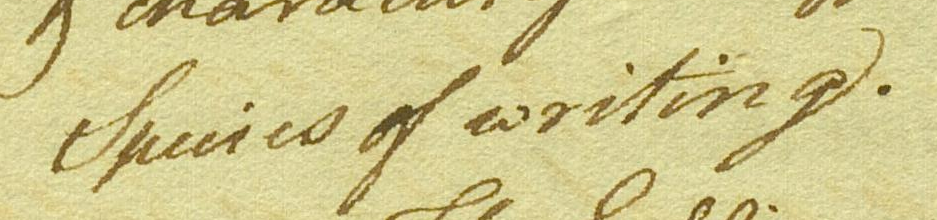Species of writing.
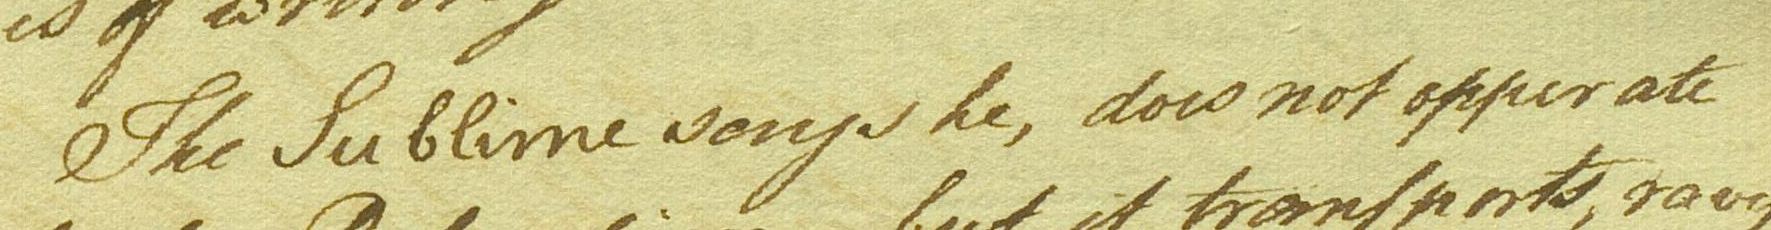The Sublime says he, does not opperate
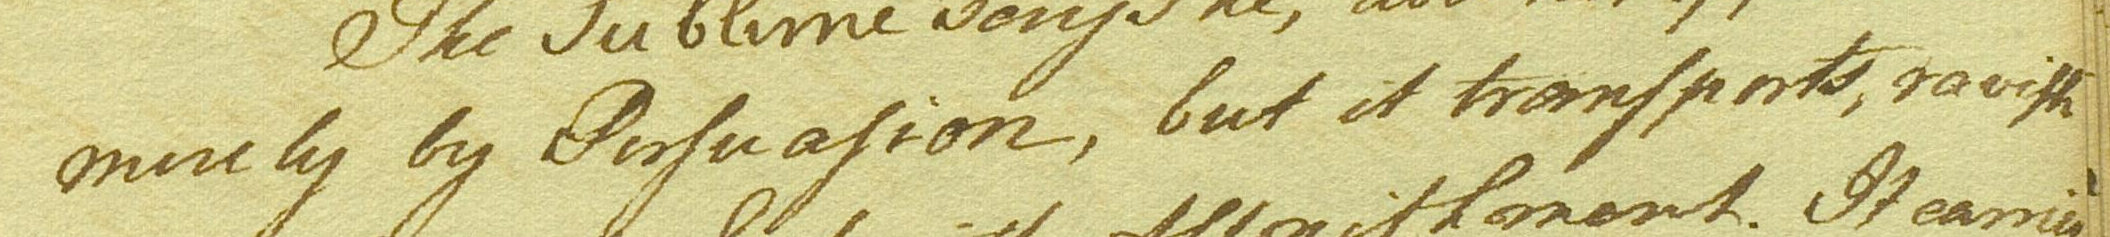merely by Persuasion, but it transports, ravish
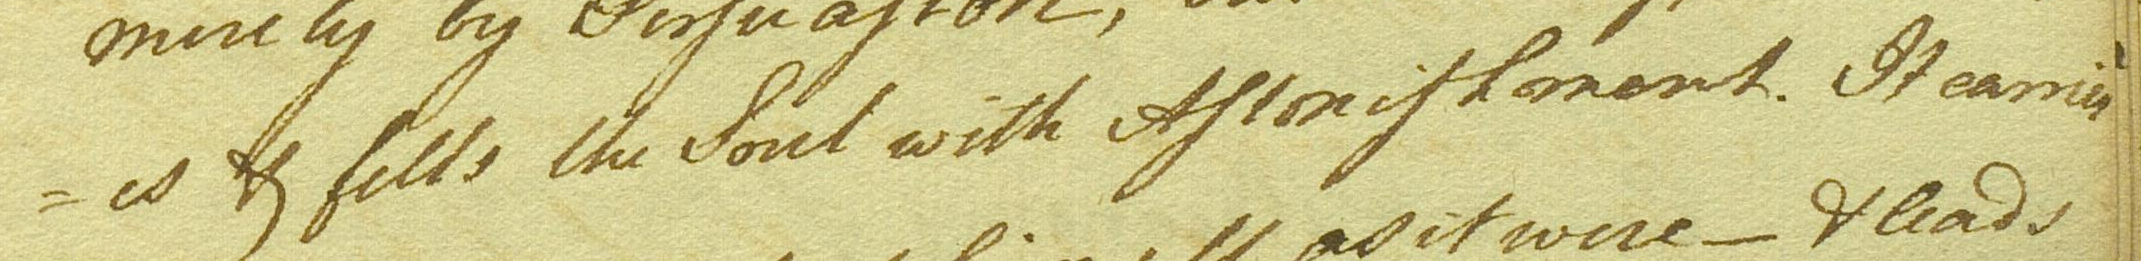-es & fells the Soul with Astonishment. It carries
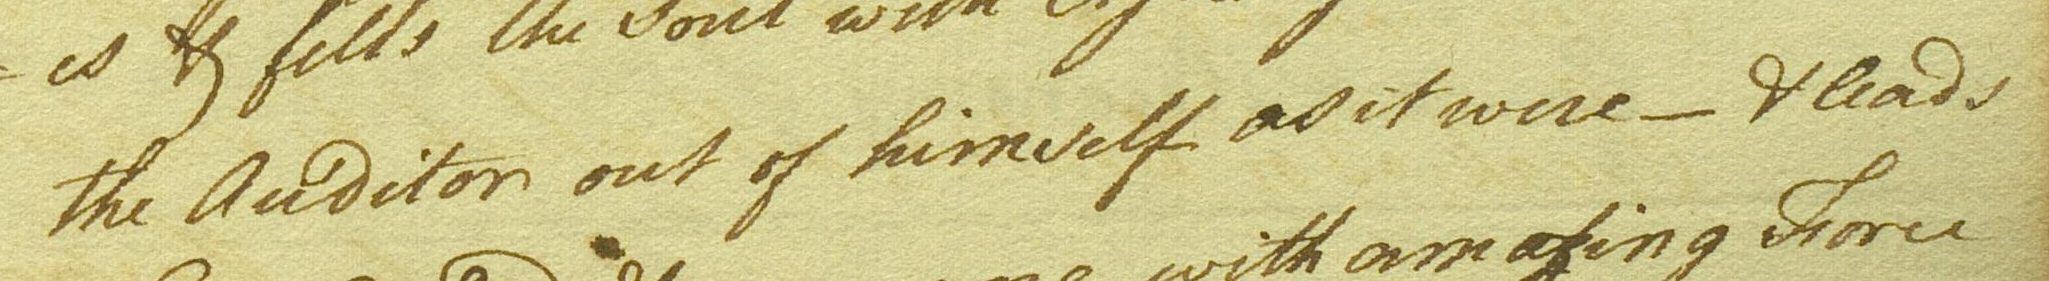the Auditor out of himself as it were – & leads
